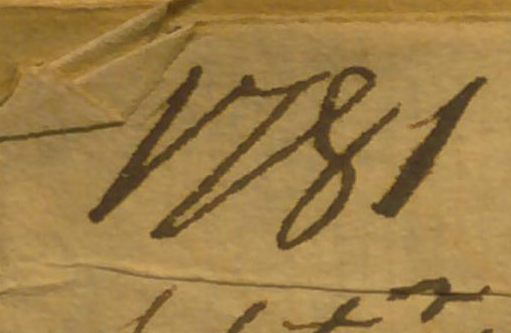1781
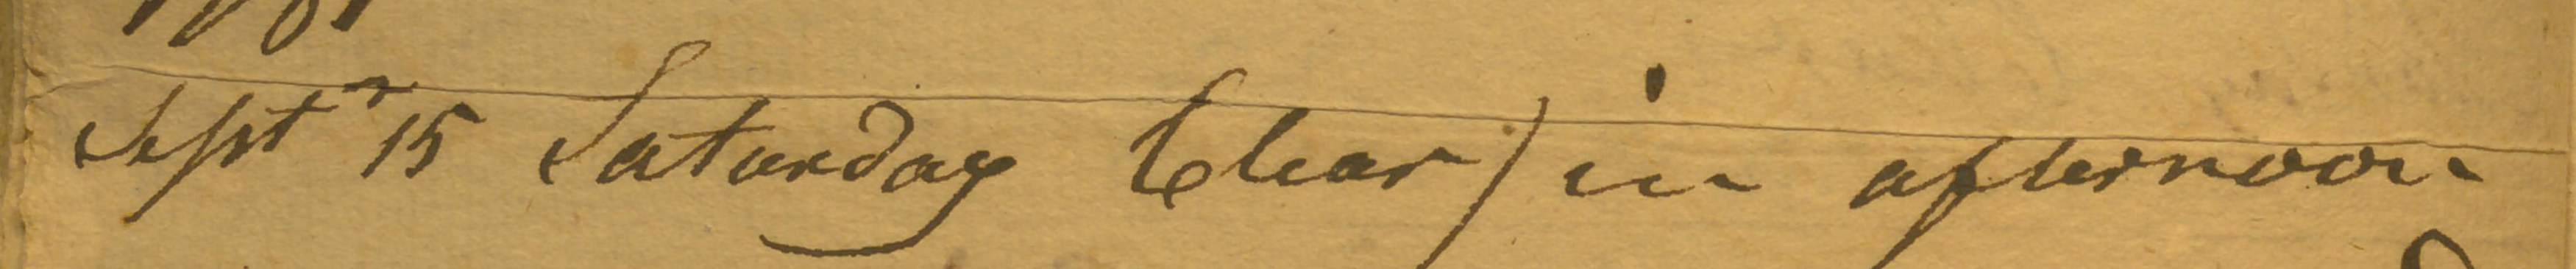Sep^r 15 Saturday Clear / in afternoon
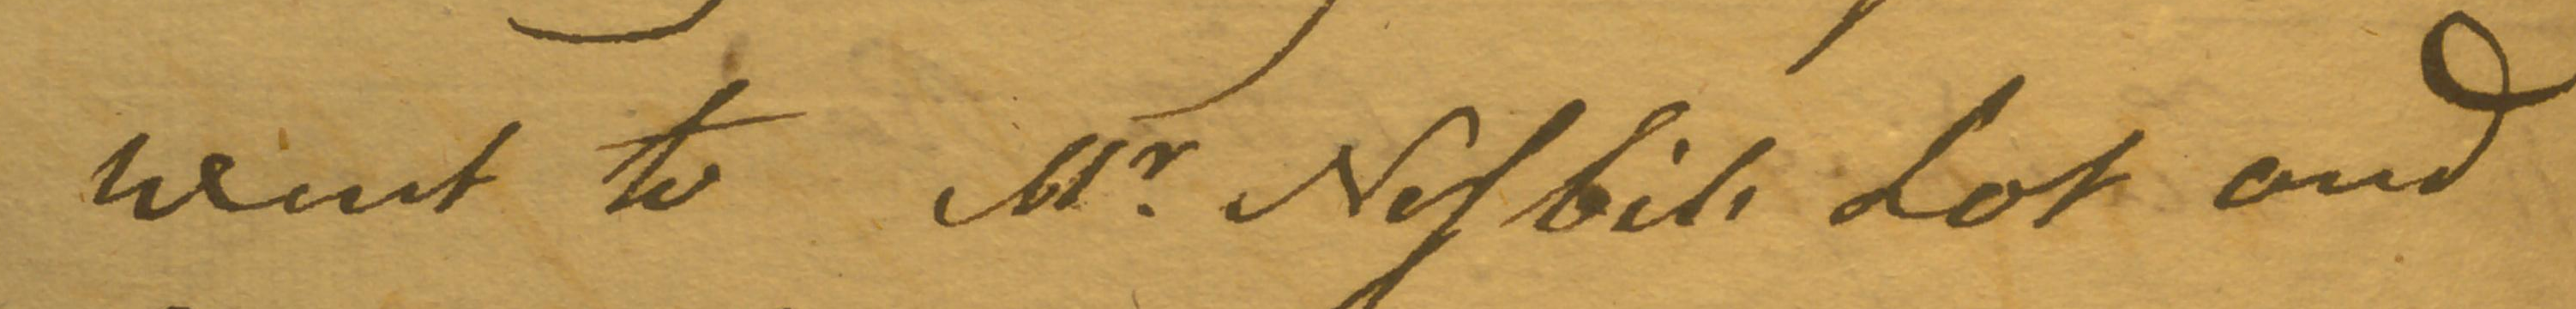went to M^r. Nesbits Lot and
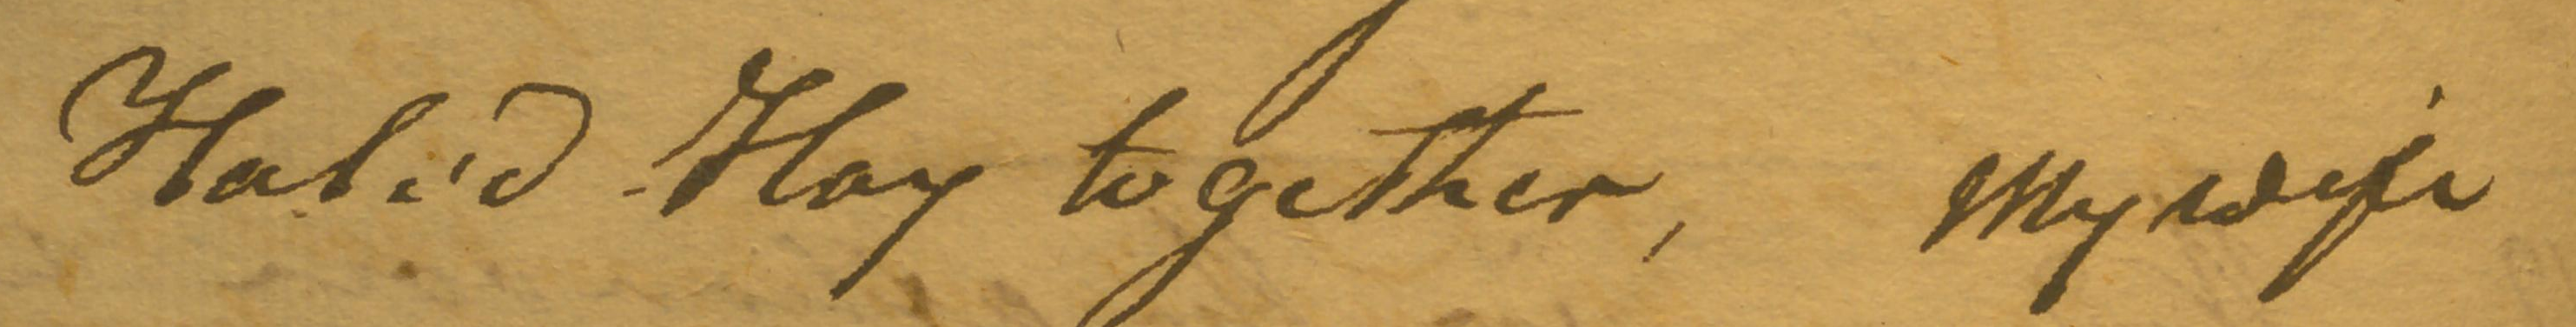Hale'd Hay together, My wife
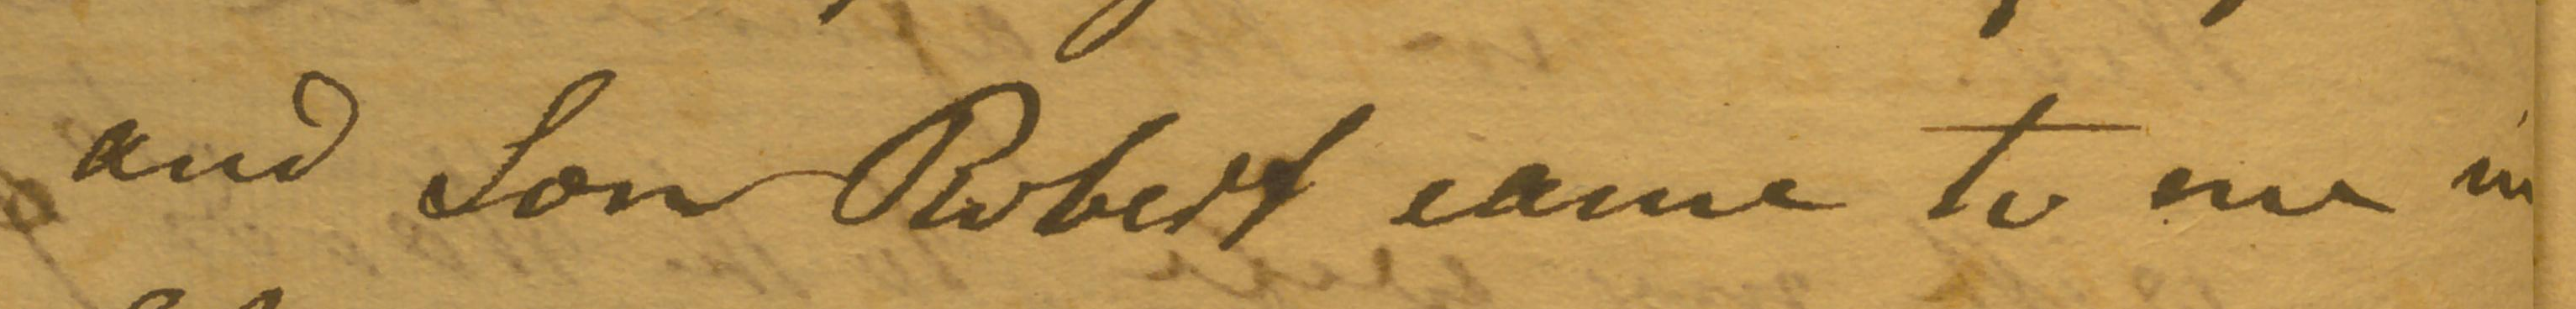and son Robert came to me in
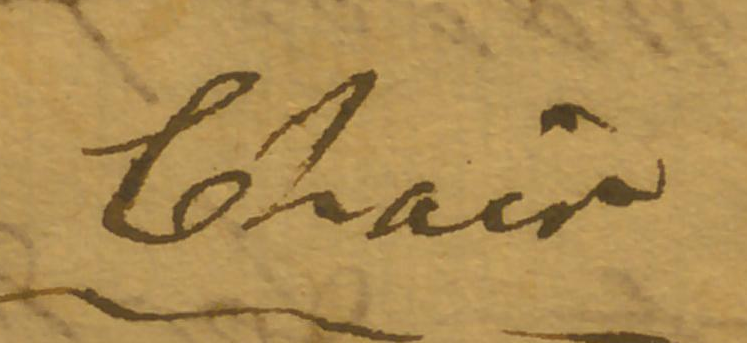Chair
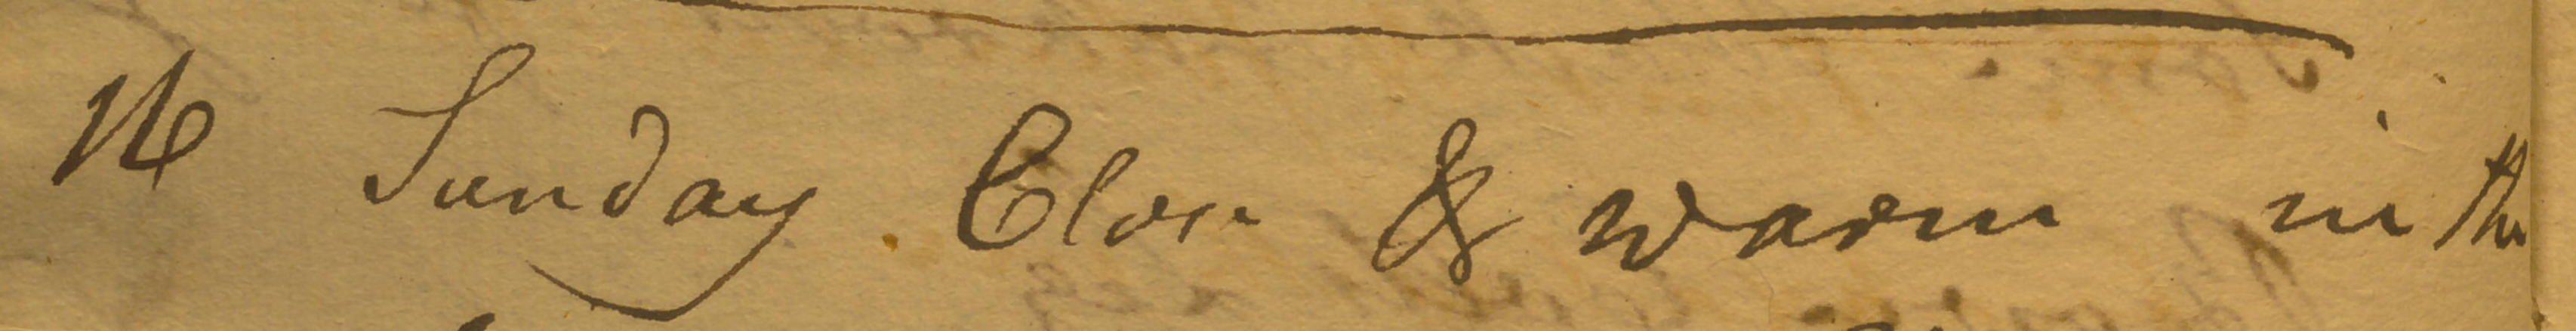16 Sunday Close & warm in the
